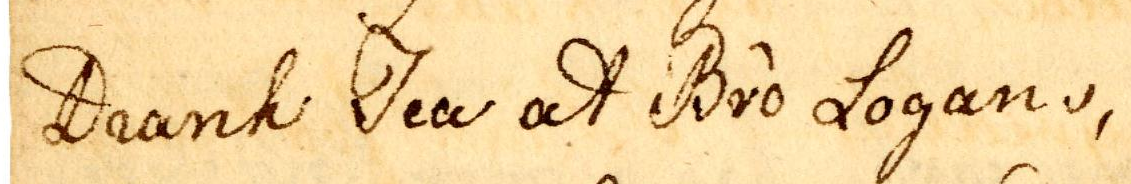Drank Tea at Bro Logans,
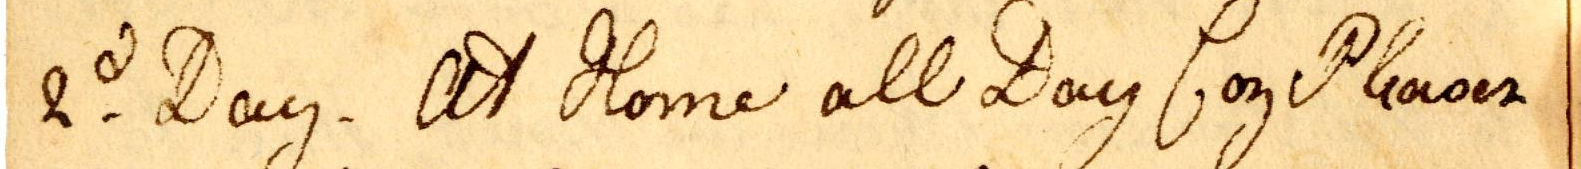2^d Day- At Home all Day Coz Pleases
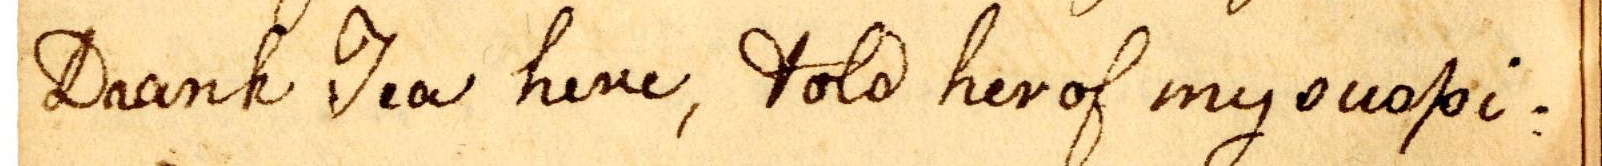Drank Tea here, told her of my suspi-
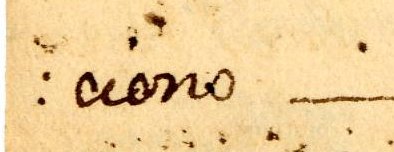-cions
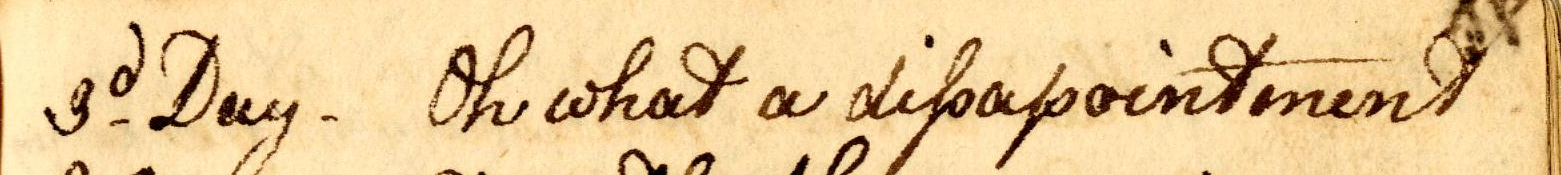3^d Day- Oh what a dissapointment
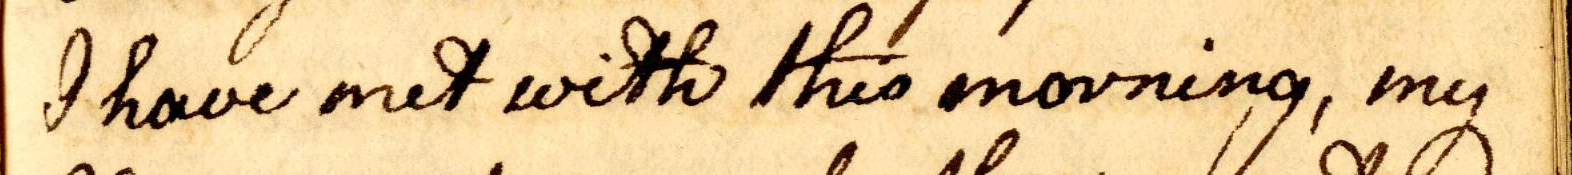I have met with this morning, my
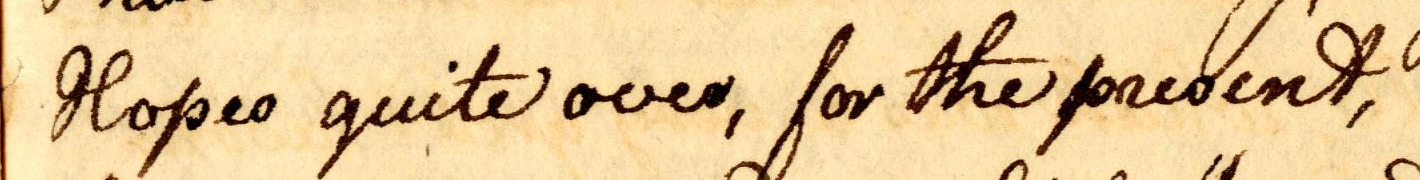Hopes quite over, for the present,
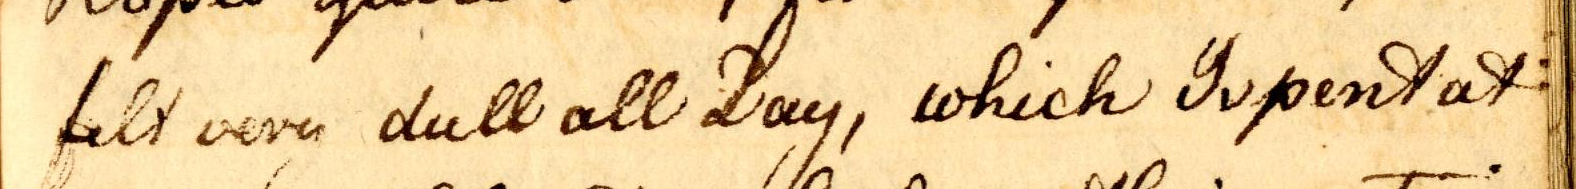felt very dull all Day, which I spent at
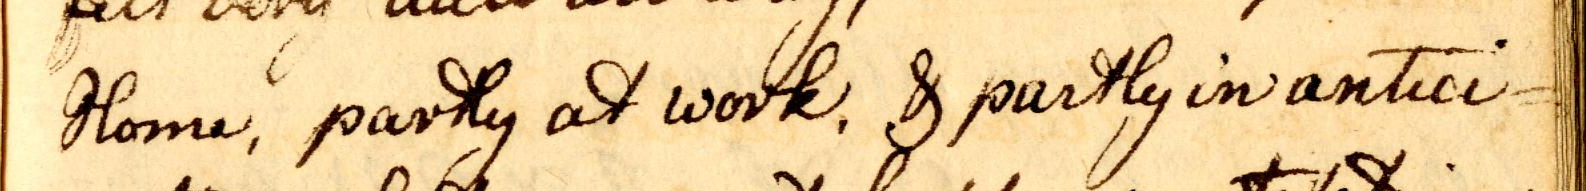Home, partly at work, & partly in antici-
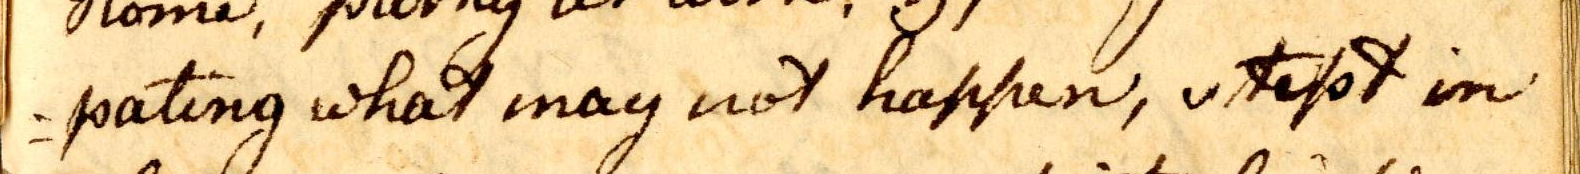-pating what may not happen, stept in
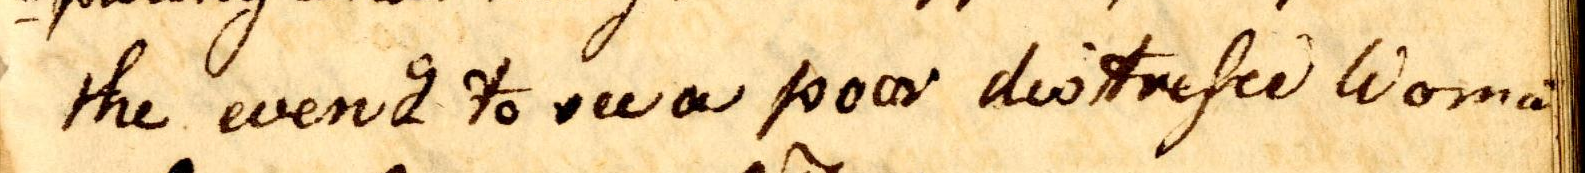the even^g to see a poor distresed Woma
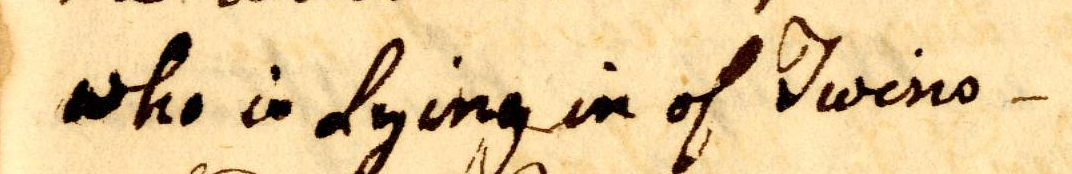who is Lying in of Twins
